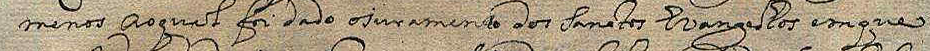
menos ao qual foi dado o iuramento dos Sanctos Evangelhos em que
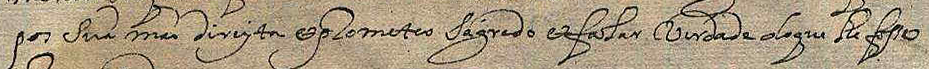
pos Sua maõ direyta e prometeo segredo e falar verdade do que lhe fosse
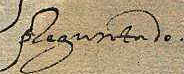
preguntado.
